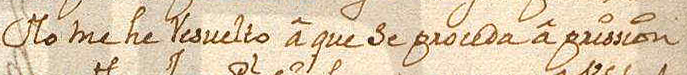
No me he Resuelto â que se proceda â prission
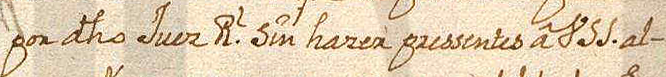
por d̄ho Iuez R.l Sin hazer pressentes à VSI. al
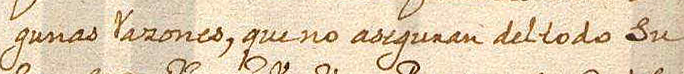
gunas Razones, que no asiguran del todo Su
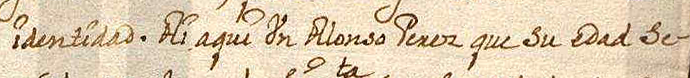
identidade. Ai aqui Vn Alonso Perez que su edad Se
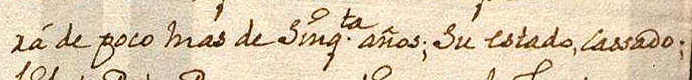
rá de poco mas de Sinq.ta años; Su estado, cassado;
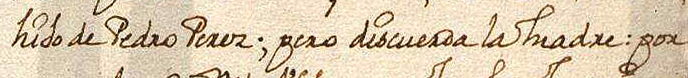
hijo de Pedro Perez; pero discuerda la Madre: por
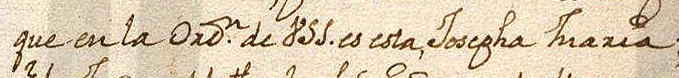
que en la Ord.n de VSI. es esta, Iosepha Maria
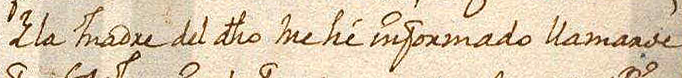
Y la Madre del d̄ho me hé informado llamarse
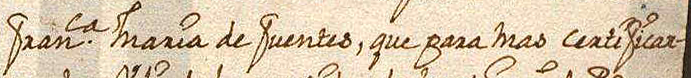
fran.ca Maria de fuentes, que para mas certificar
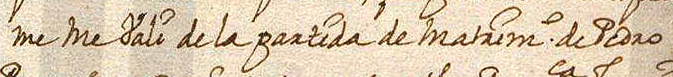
me me Vali de la partida de matrim.o de Pedro
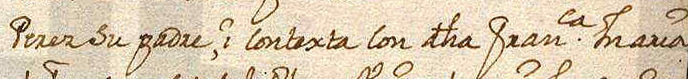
Perez su padre, i contexta con d̄ha fran.ca Maria
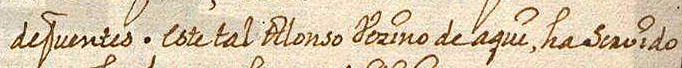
de fuentes. Este tal Alonso Vezino de aqui, ha Servido
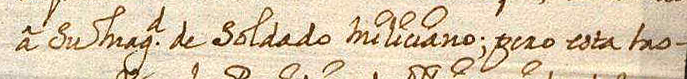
â Su Mag.d de Soldado miliciano; pero esta tro
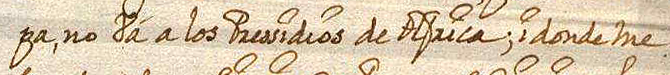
pa, no Vá a los Pressidios de Africa; i donde me
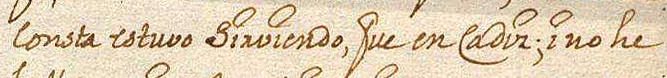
consta estuvo Sirviendo, fue en Cadiz; i no he
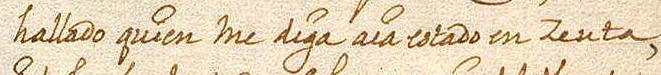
hallado quien me diga aia estado en Zeuta,
